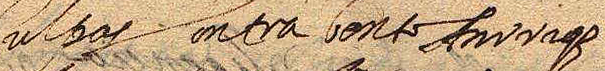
Culpas Contra bento Anrriqz
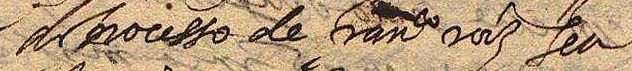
do processo de franco roiz̄ seu
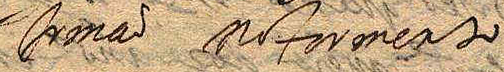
Irmaõ no tormento
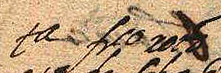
ta frco roiz̄
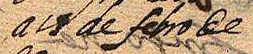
a 15 de febro de
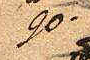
90.
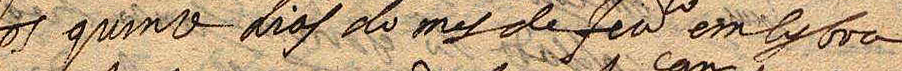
Aos quinze dias do mes de fevro em lisboa
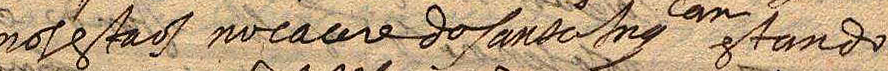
nos staos no cacere da Santa Inqcam stando
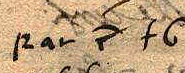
Rat ē f 6
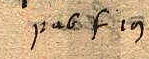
pub f 19
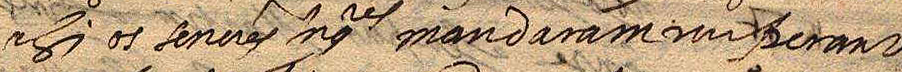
ahi os senorēs Inqres mandaram vir perante
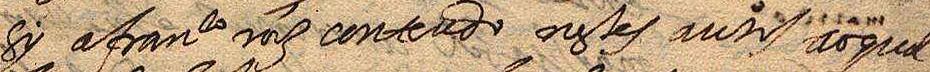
sy a franco roīz conteudo nestes autos ao qual
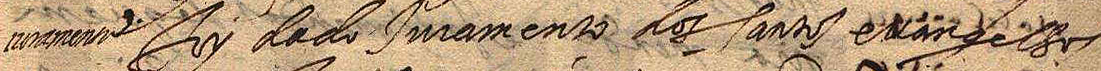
foy dado Iuramento dos santos euangelhos
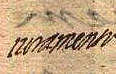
iuramento
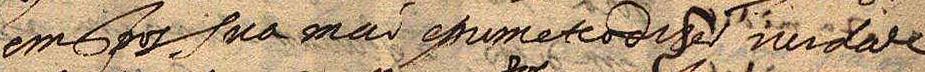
em pos sua maõ e prometeo dizer uerdade
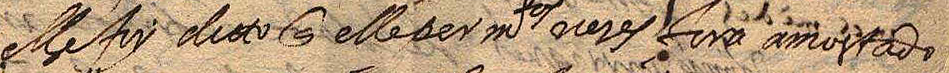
e lhe foy dicto q̄ elle per mtas uezes fora amoestado
